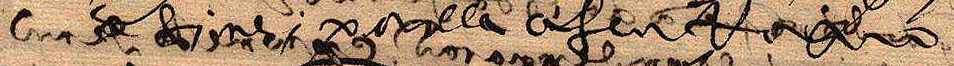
asjnej por ella a seu Roguo
